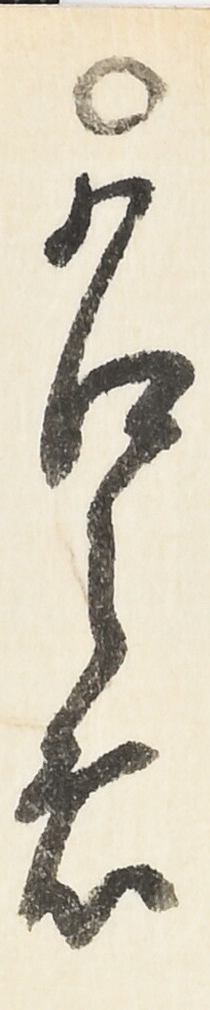〇右之者
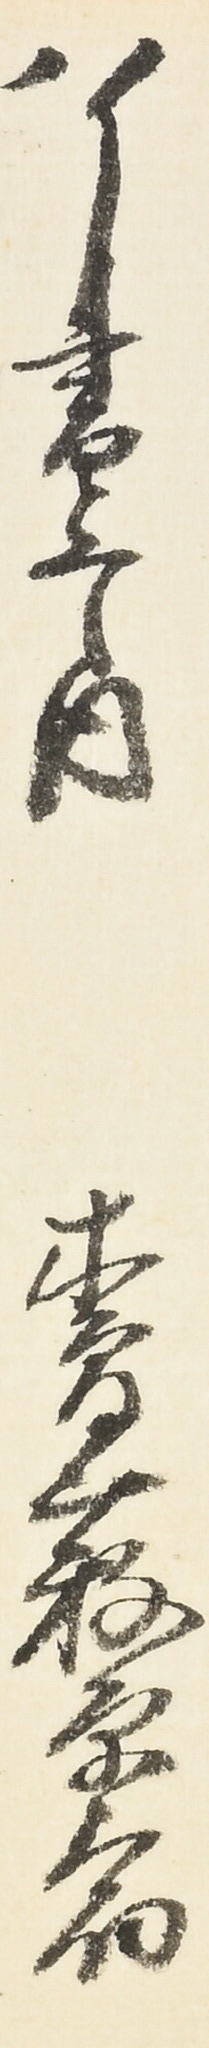八月書上之内木曽藪原宿
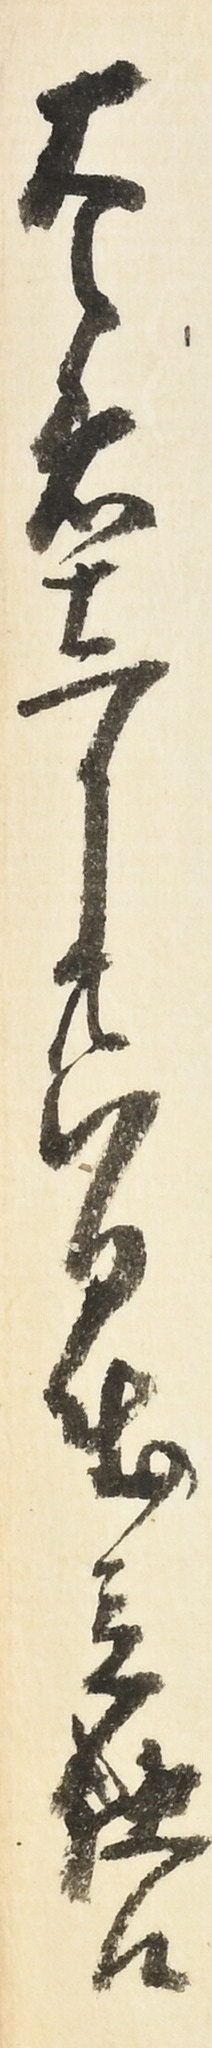右之者十二月廿八日出立仕候

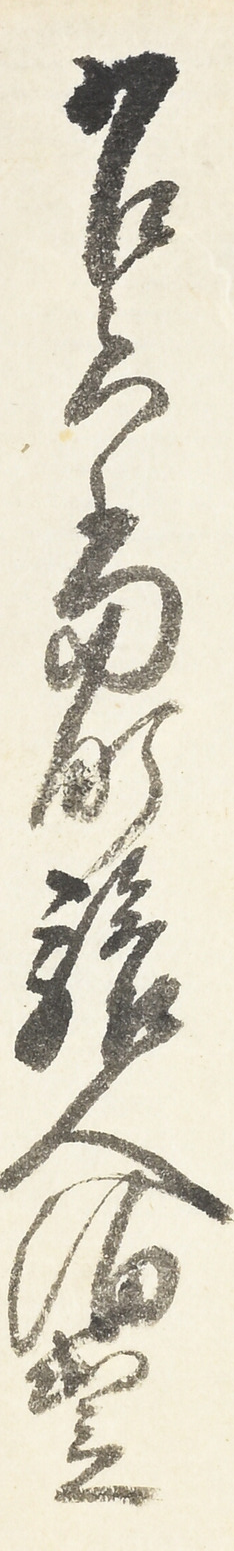右者当町旅人泊出立
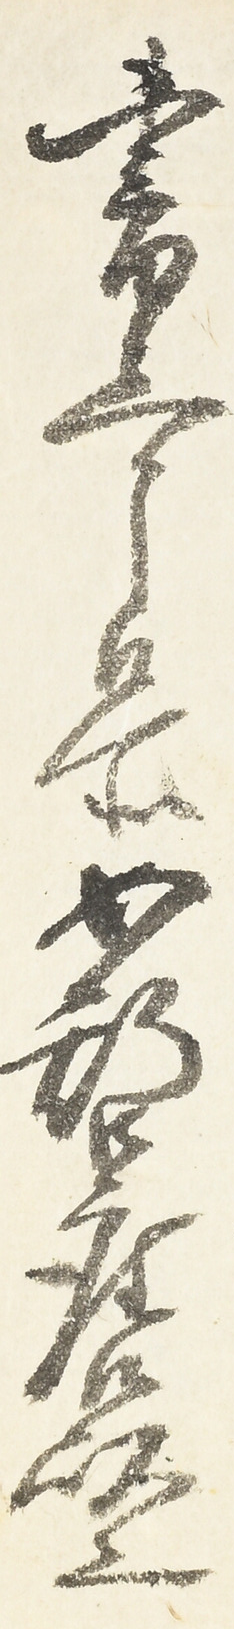書上申候所如斯御座候以上
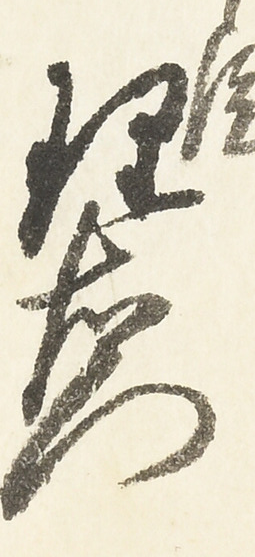理右衛門
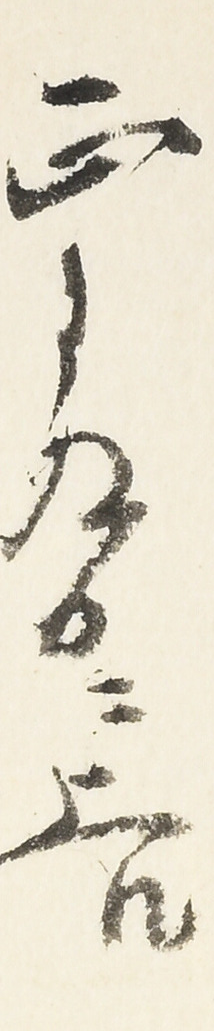正月九日ニ上ル
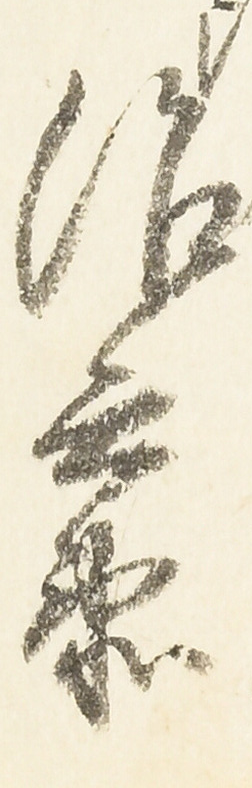治兵衛
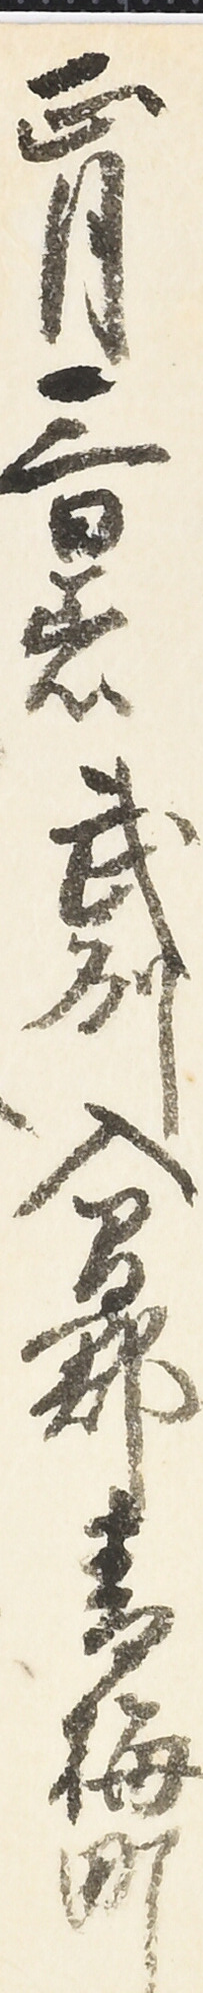正月三日着武州入間郡青梅町
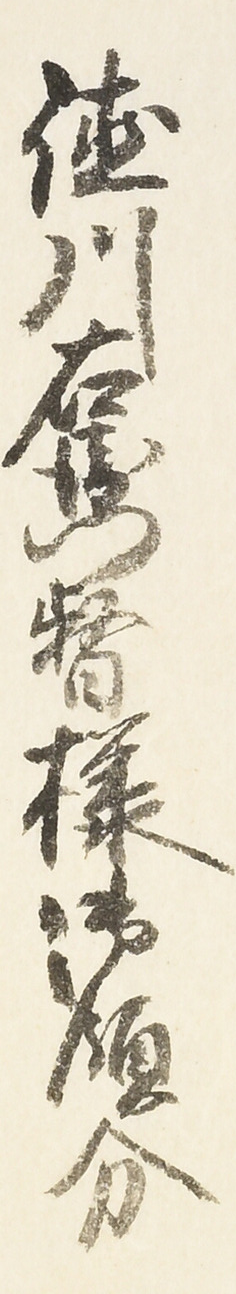徳川右衛門督様御領分
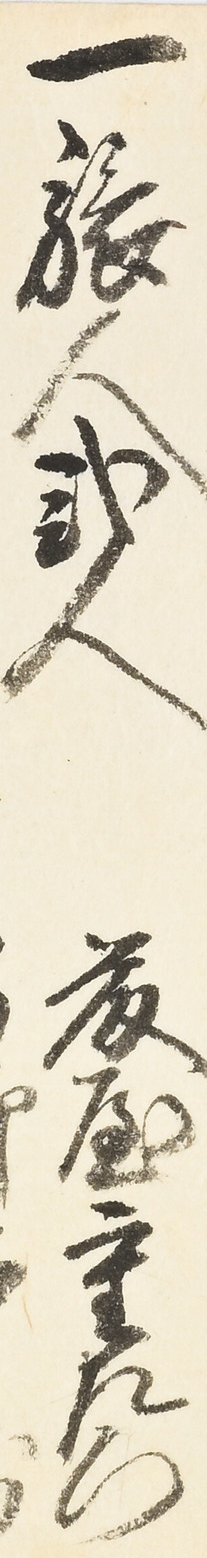一旅人弐人藤屋重左衛門
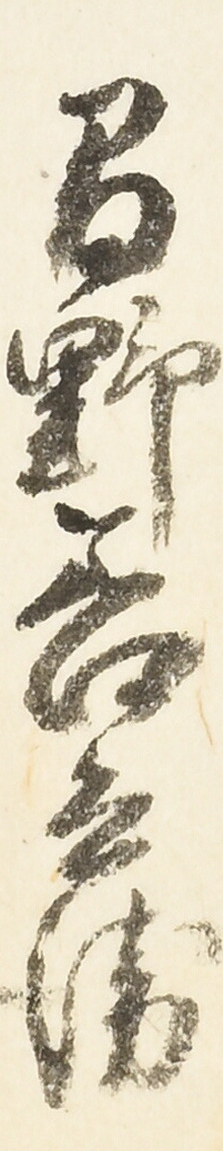間野善兵衛
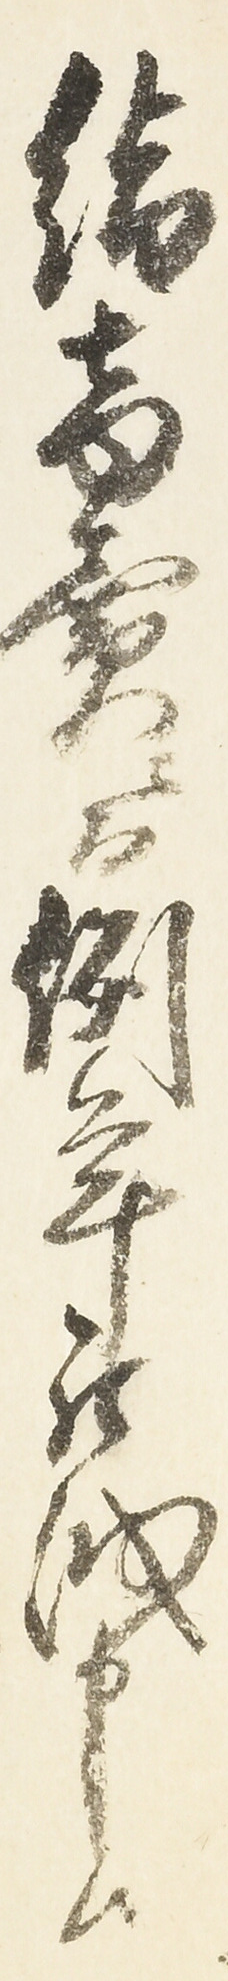絹商売ニ而例年罷越申候
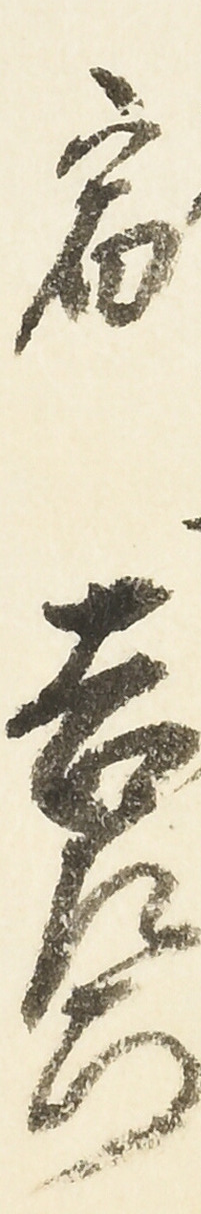宿吉左衛門
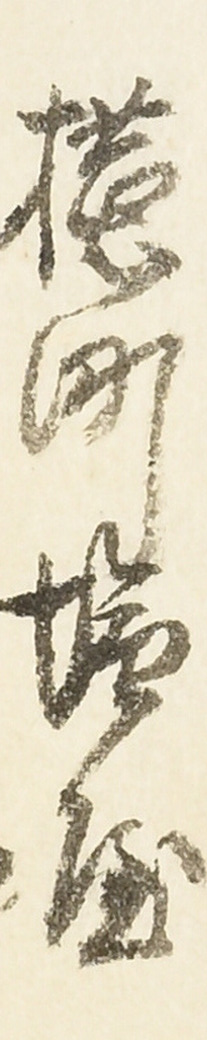横町塩屋
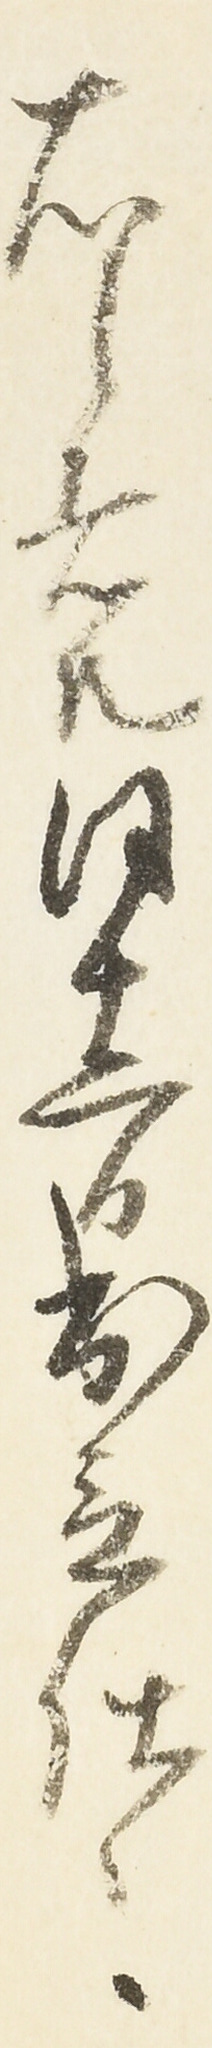右之者共同十二日出立仕候
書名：町中旅人泊控帳
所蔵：伊那市立高遠町図書館・合同会社AMANE
